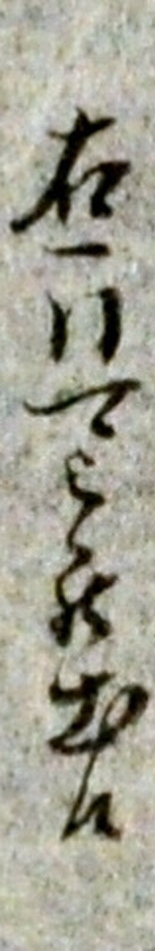❘右一同可被罷出候
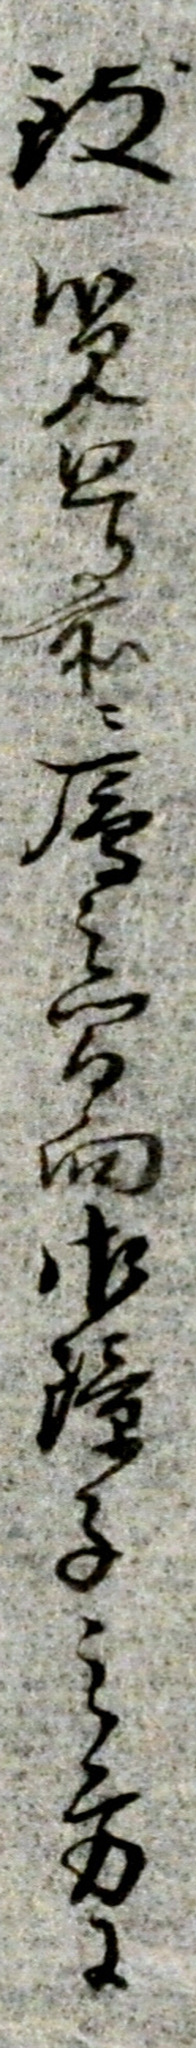致一覧廻り前ニ鴈之間向御障子之方に
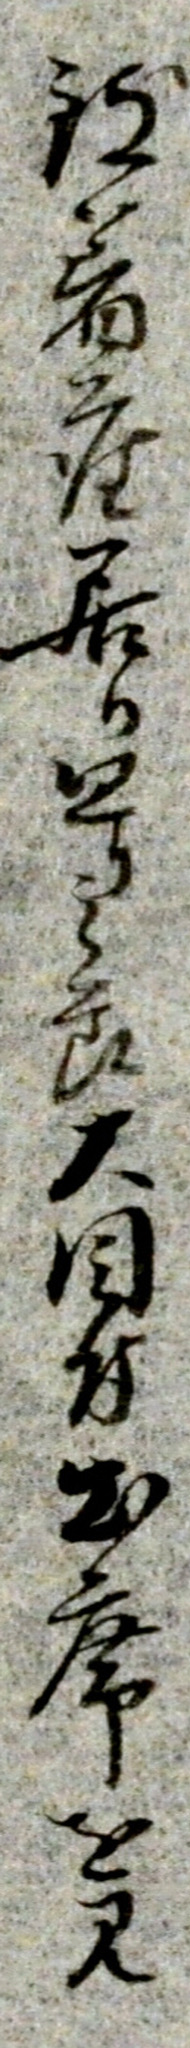致着座居り廻り之節大目付出席を見
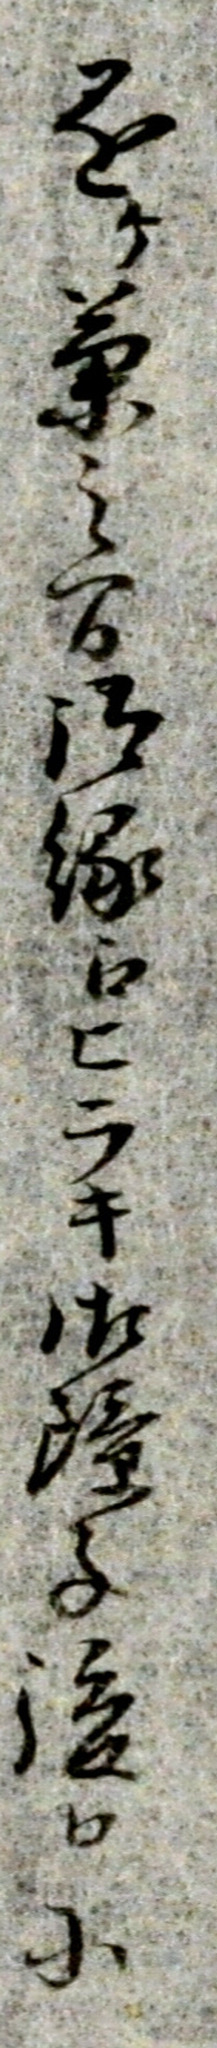懸ヶ菊之間御縁江ヒラキ御障子後ロに
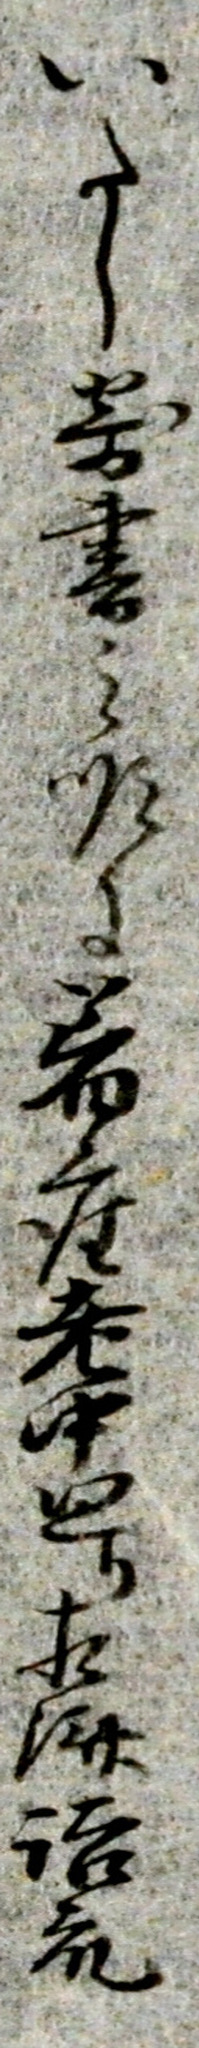いたし寄書之順に着座老中廻り相済詰衆
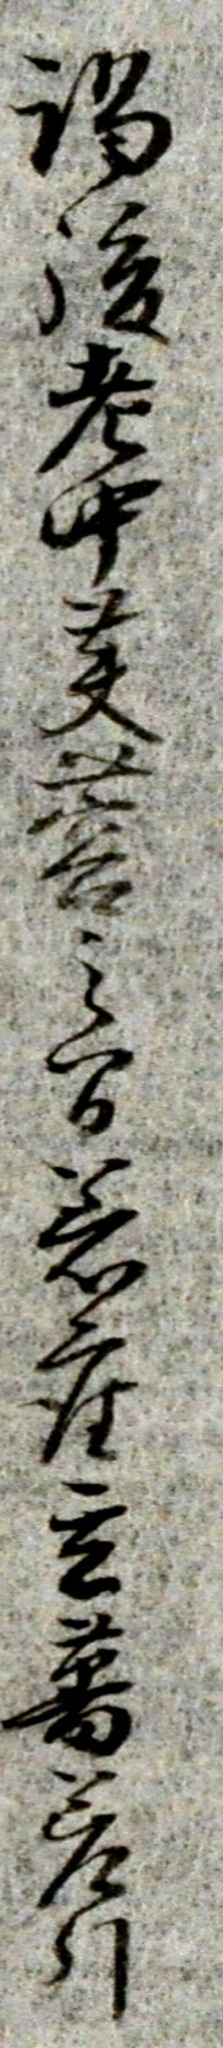謁後老中芙蓉之間着座玄蕃差引
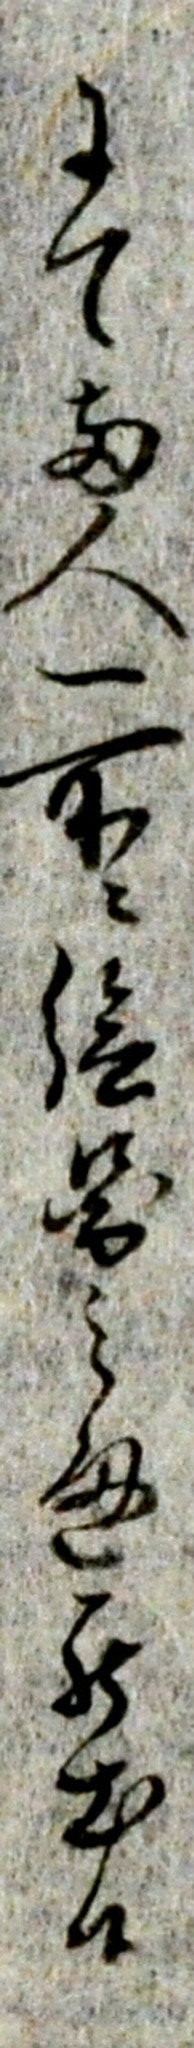にて両人一所ニ絵図之通罷出候

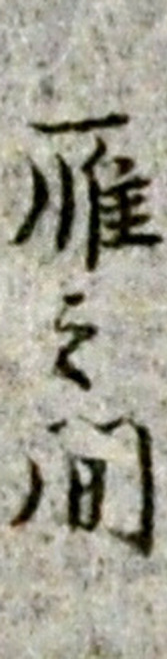雁之間
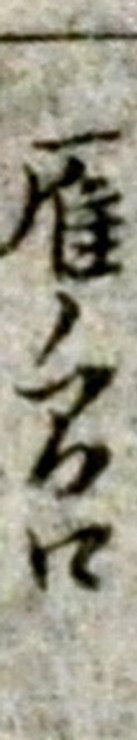雁ノ間口
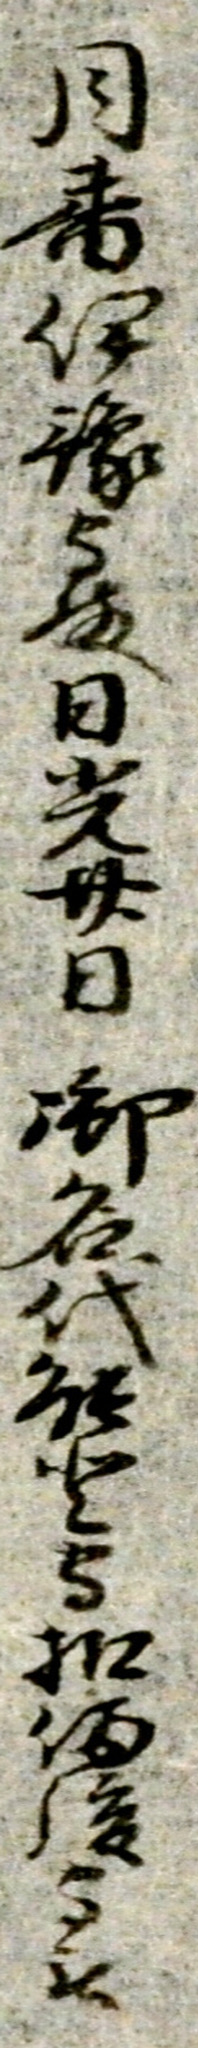月番伊豫守殿日光廿日御名代能登守扣備後守被
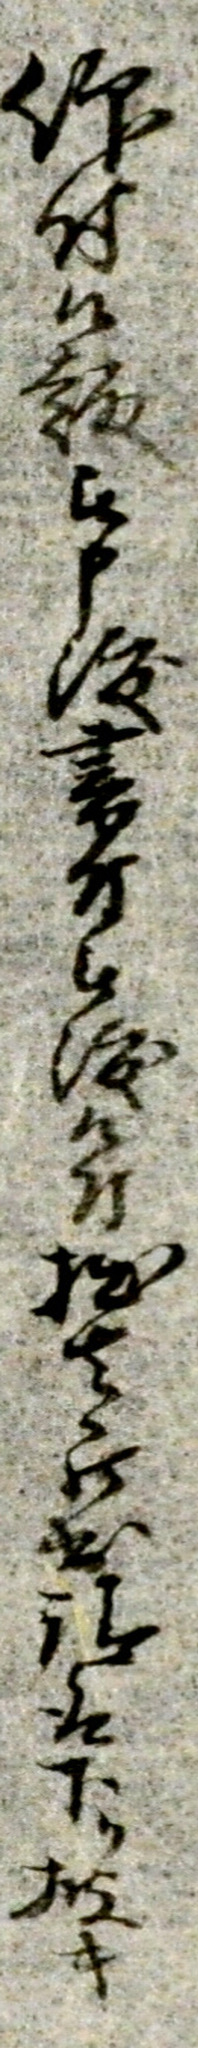仰付候趣被申渡書付候渡候付拙者罷出請取下り披キ
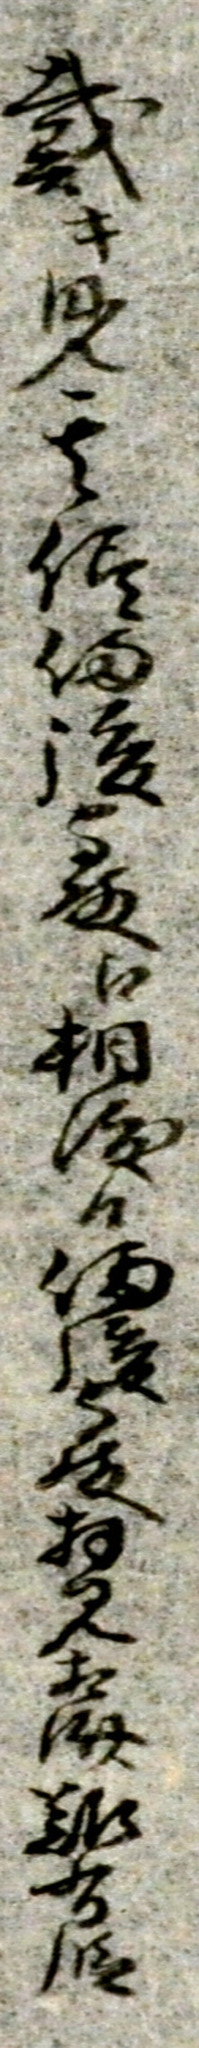戴キ見其儘備後守殿江相渡候備後守殿拝見相済難有段
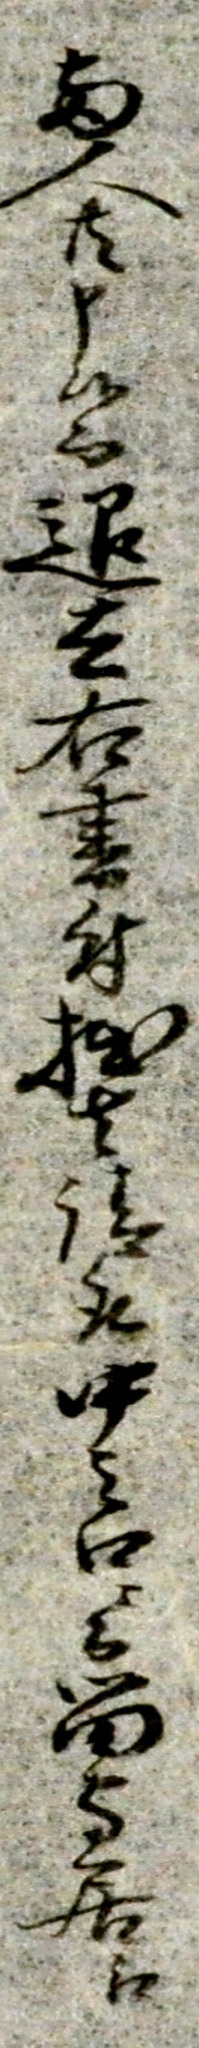両人共申候而退去右書付拙者請取中之口ニ而留守居江
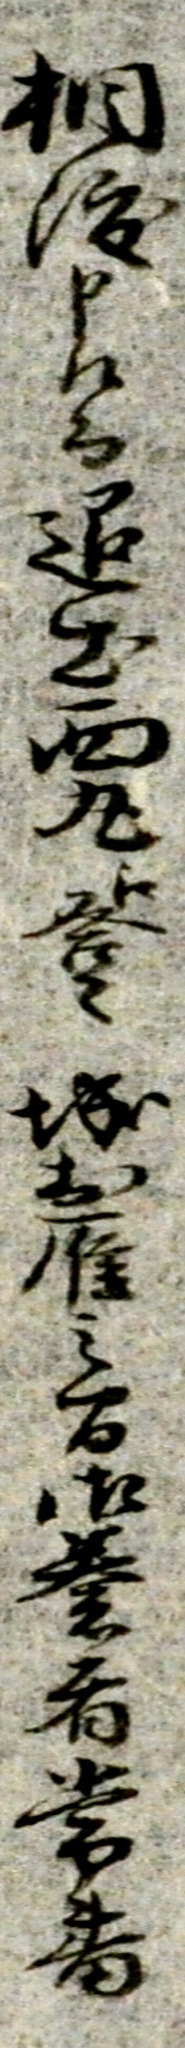相渡申候而退去西丸江登城出雁之間御奏者定番
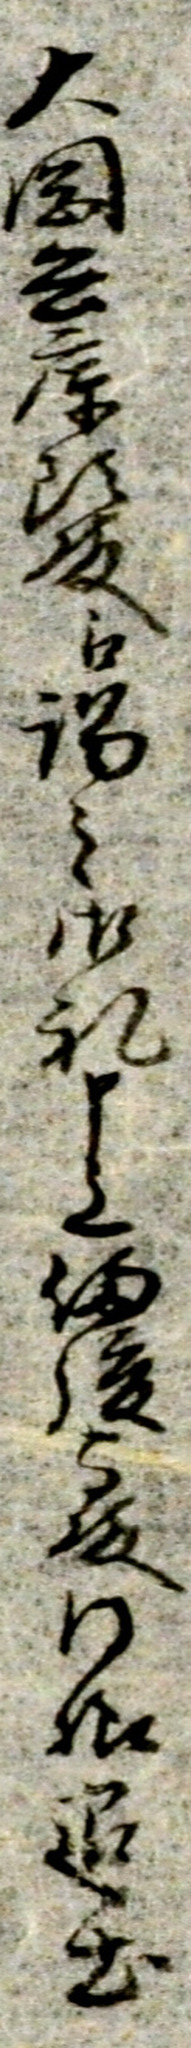大岡兵庫頭殿江謁之御礼申上備後守殿同様退出
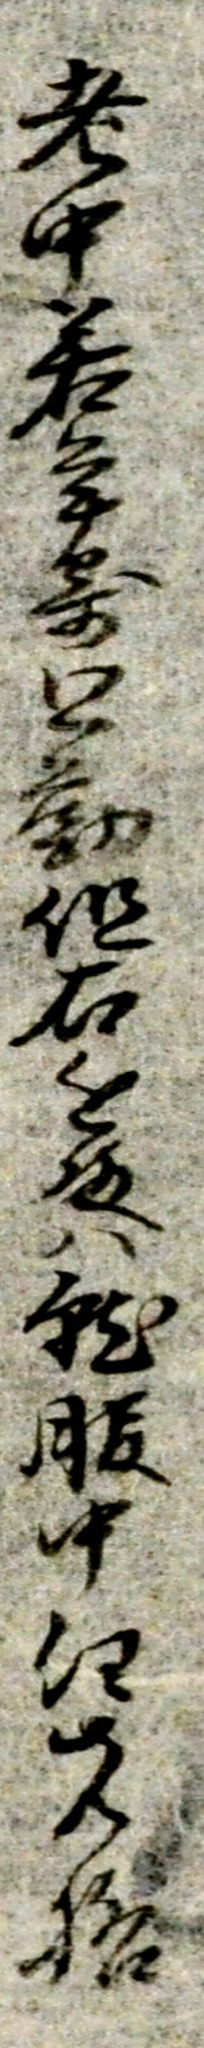老中若年寄廻勤但右近殿ㇵ就服中以先格
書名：日光御名代相勤候節ノ留
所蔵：伊那市立高遠町図書館・合同会社AMANE
